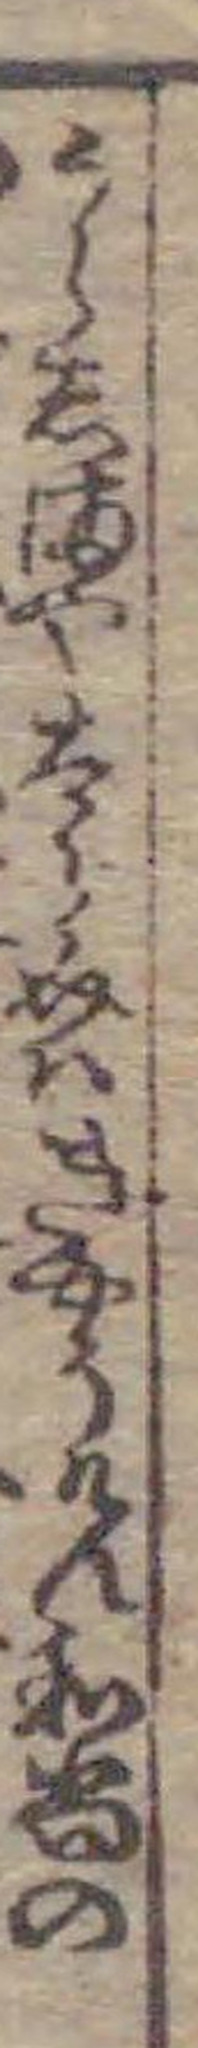うらしまや太郎介はきやうけん和尚の
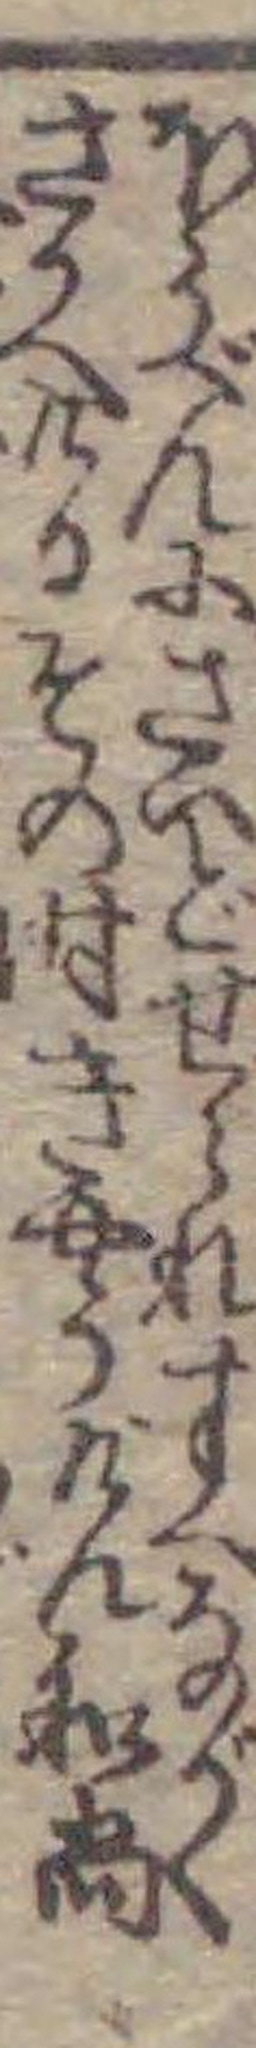さかへけるその時きやうげん和尚
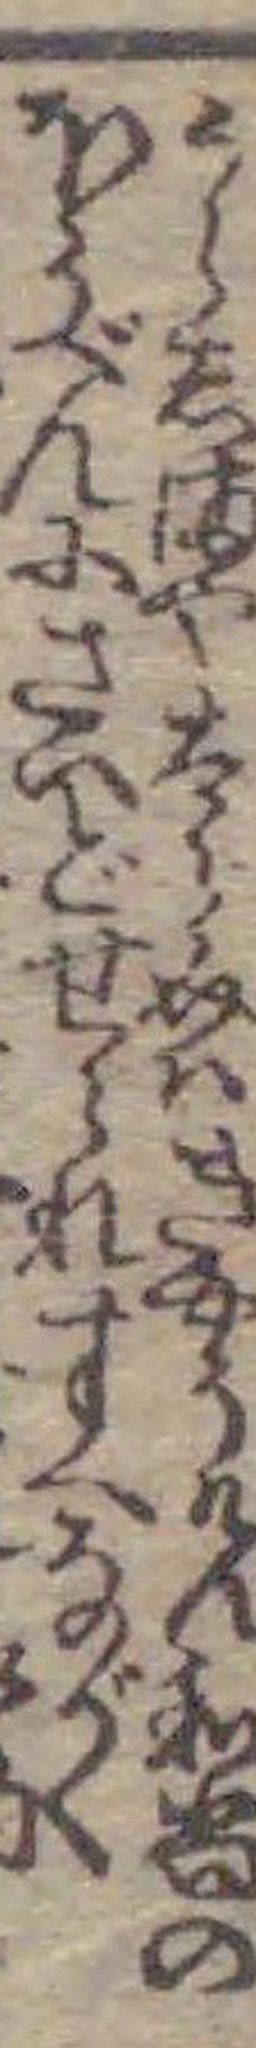ほうべんにさいどせられすへながく
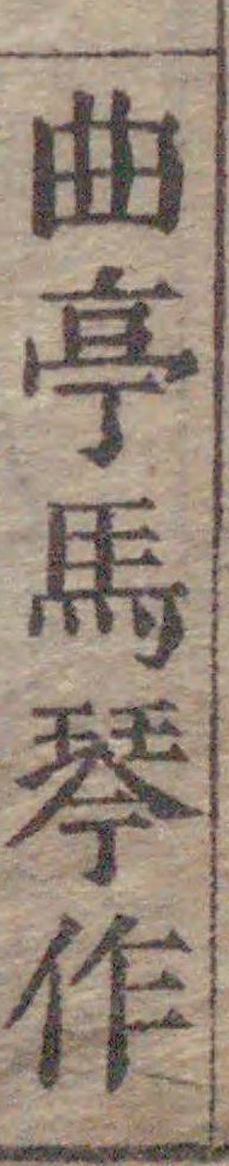曲亭馬琴作
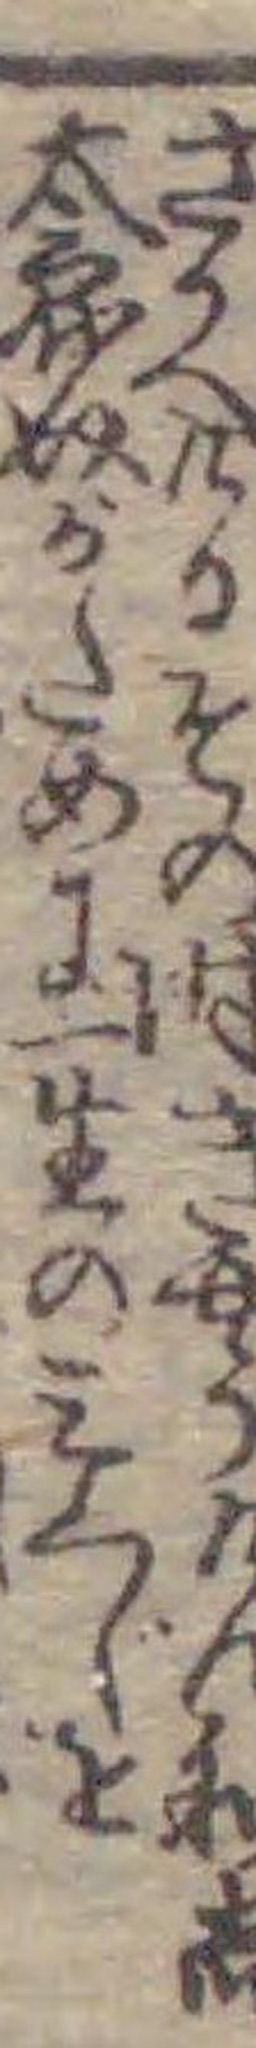太郎介がために一生のみくじを
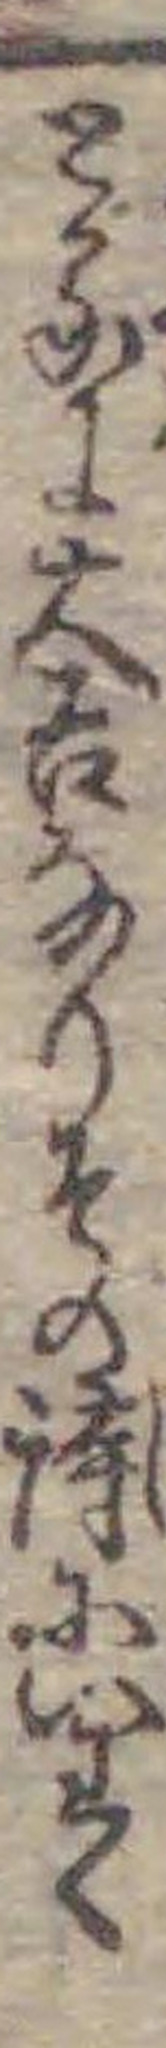とるに大吉なりその詩にいわく
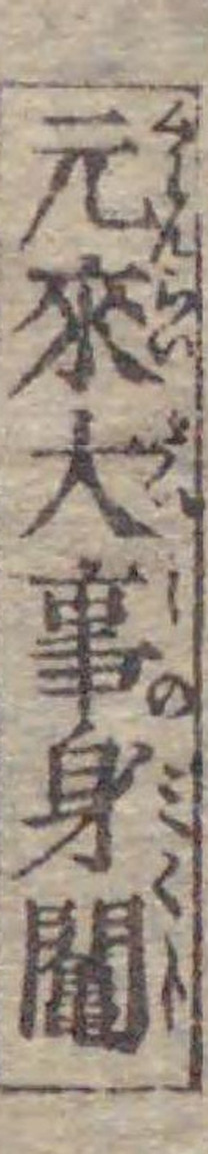元来大事身鬮
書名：四遍搨心学草帋 : 3巻
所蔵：国立国会図書館 National Diet Library, JAPAN
